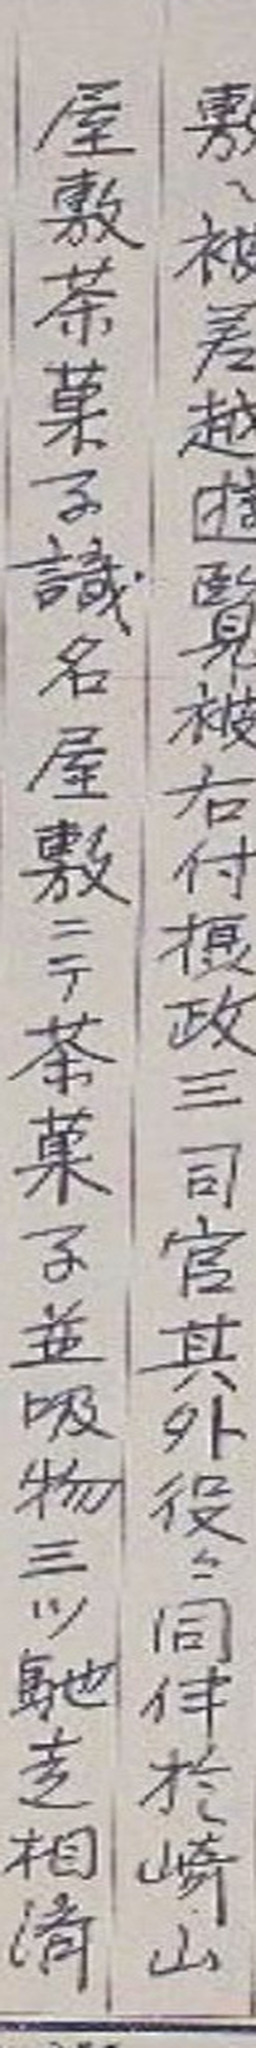屋敷茶菓子識名屋敷にて茶菓子並吸物三つ馳走相済
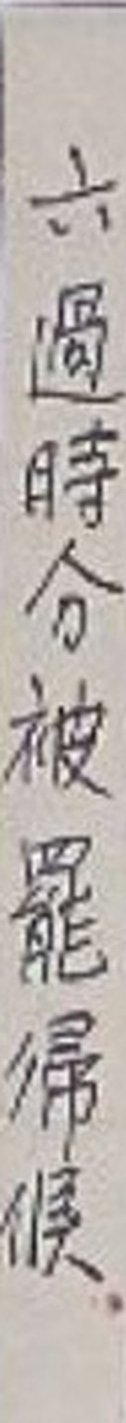六過時分被罷帰候
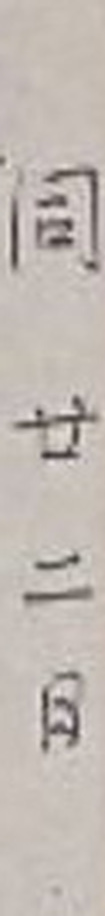同廿二日
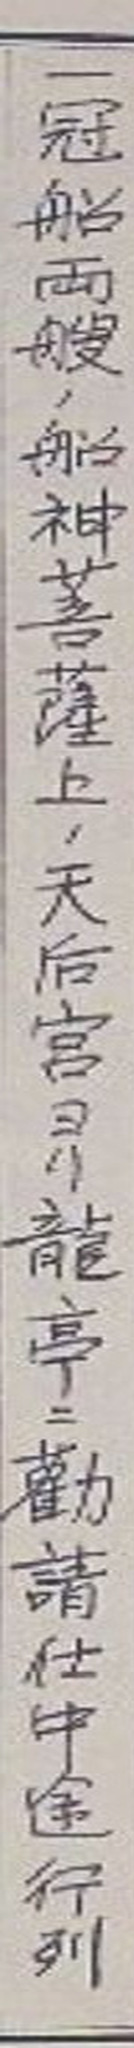一冠船両艘の船神菩薩上の天后宮より龍亭に勧請仕中途行列
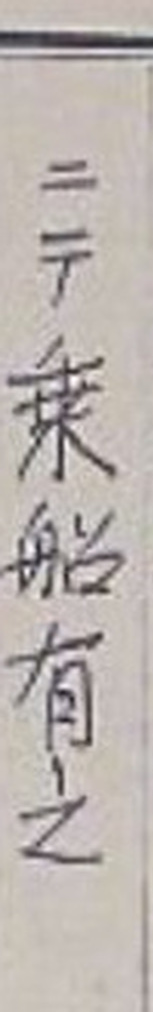にて乗船有之
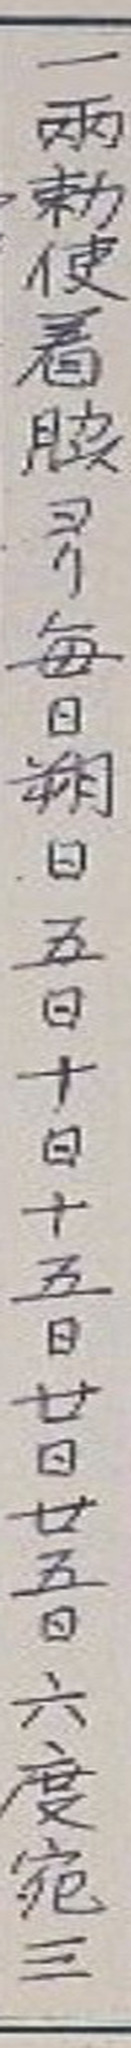一両勅使着脇より毎日朔日五日十日十五日廿日廿五日六度宛三
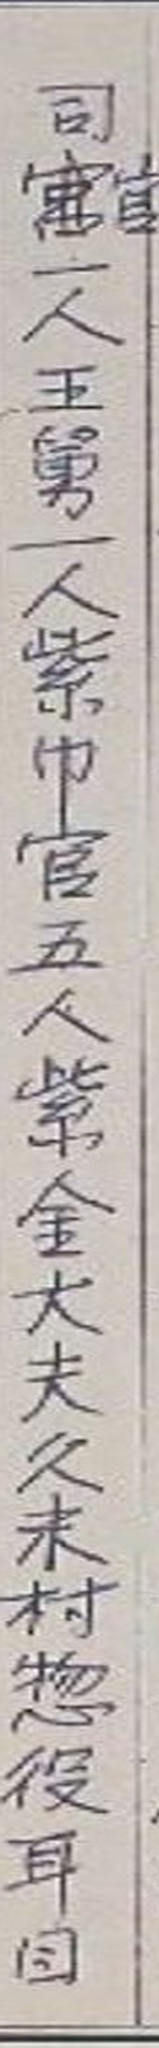司官一人王舅一人紫巾官五人紫金大夫久米村惣役耳目
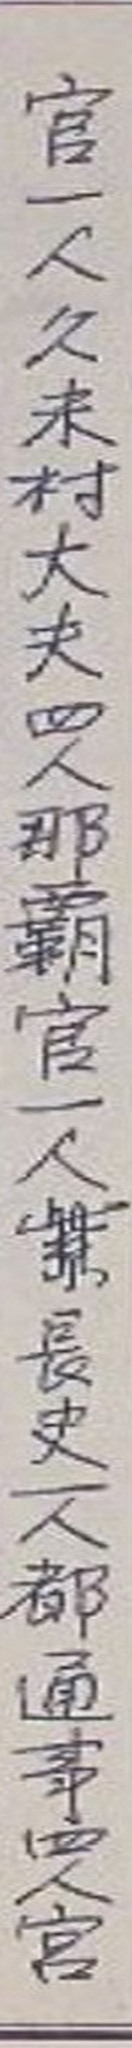官一人久米村大夫四人那覇官一人紫長史一人都通事四人宮
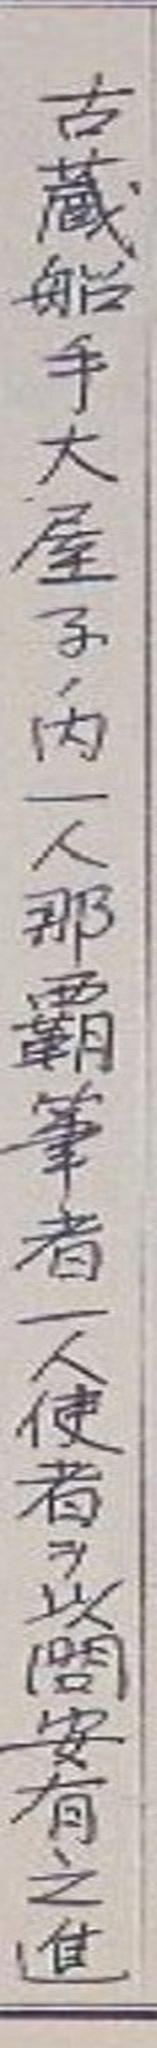古蔵手大屋子の内一人那覇筆者一人使者を以問安有之進
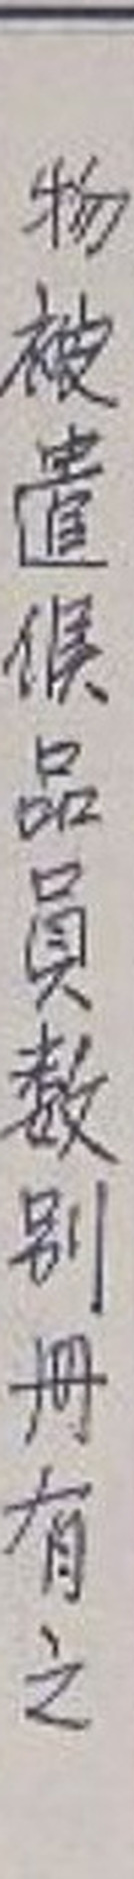物被遣候品員数別冊有之
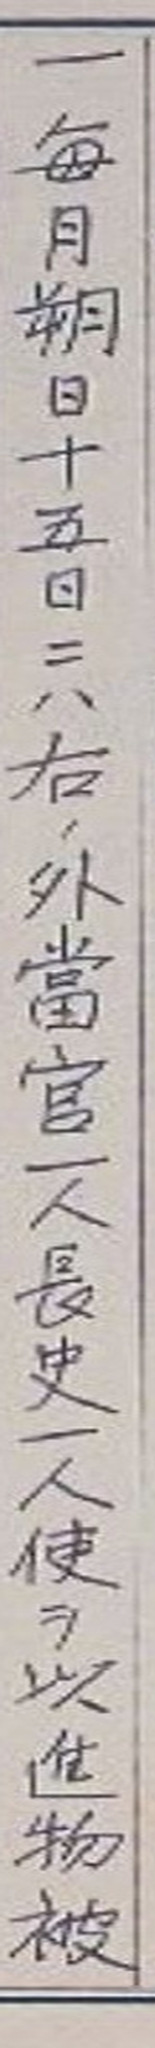一毎月朔日十五日には右の外当官一人長史一人使を以進物被
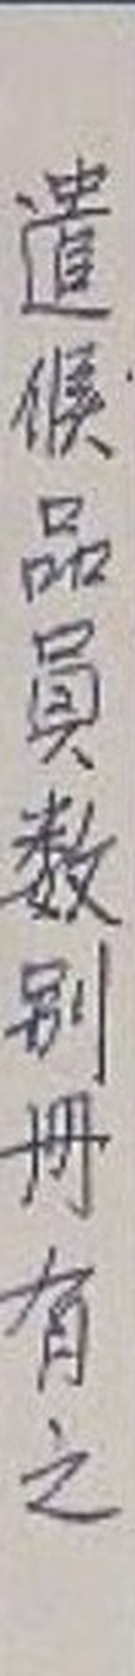遣候品員数別冊有之
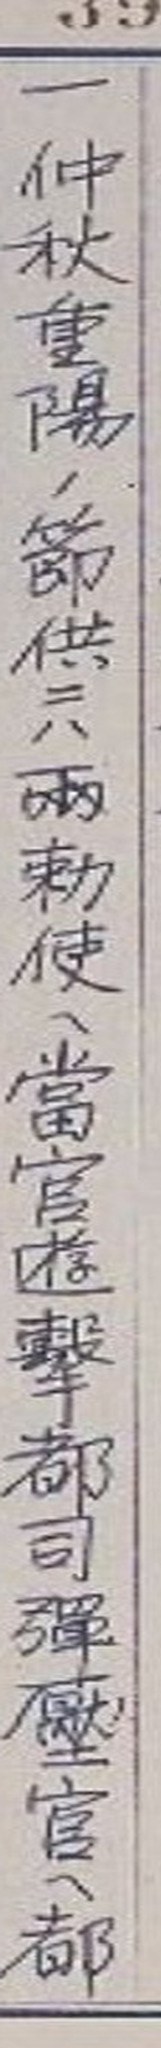一仲秋重陽の節供には両勅使へ当官遊撃都司弾圧官へ都
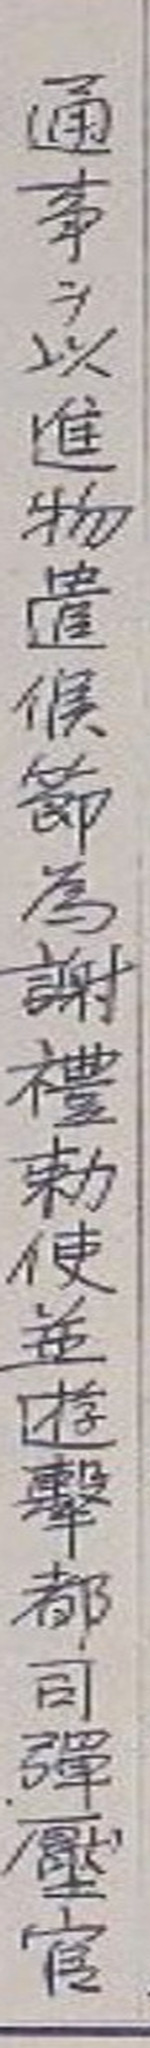通事を以進物遣候節為謝礼勅使並遊撃都司弾圧官
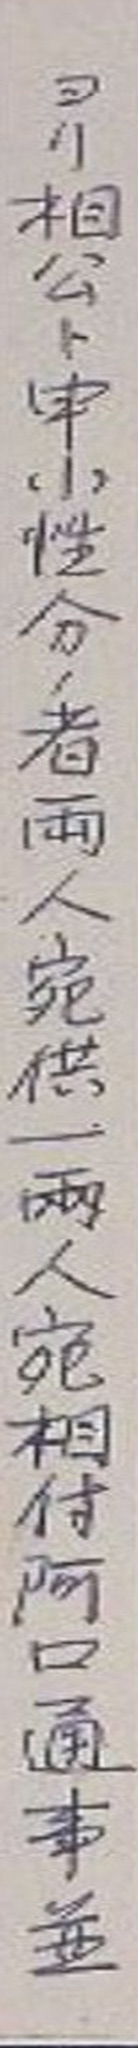より相公と申小性分の者両人宛供一両人宛相付阿口通事並

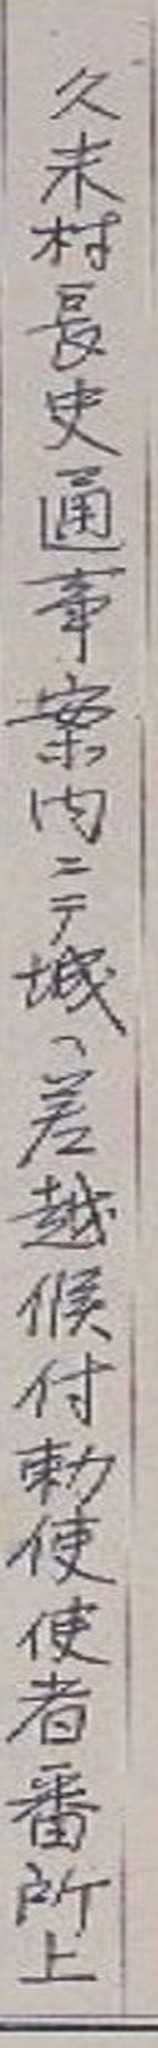久米村長史通事案内にて城へ差越候付勅使使者番所上
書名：支那冊封使来琉諸記 下巻
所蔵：University of the Ryukyus Library
